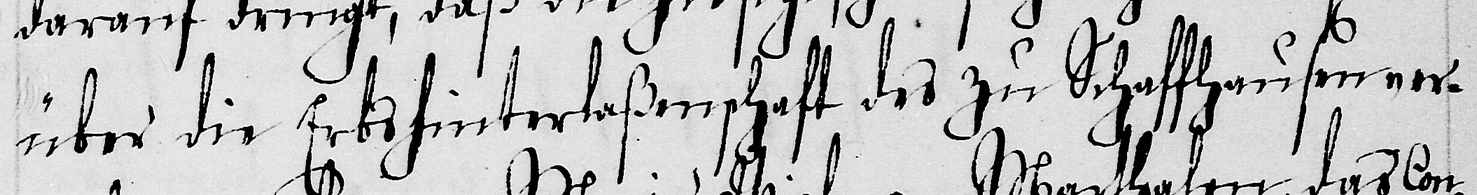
über die Erbshinterlaßenschaft des zu Schaffhausen ver¬
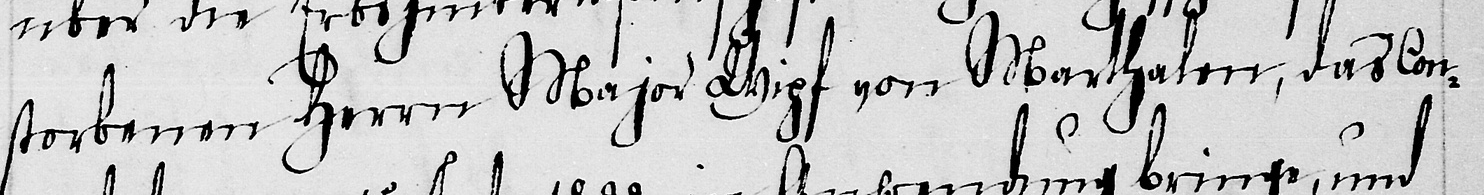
storbenen Herrn Major Wipf von Marthalen, das Con¬
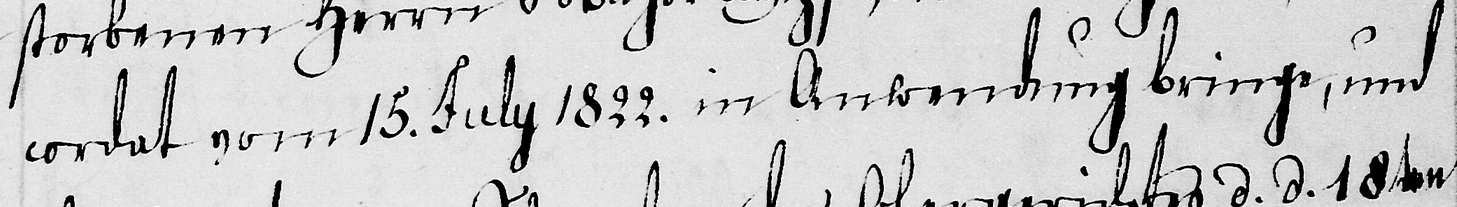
cordat vom 15. July 1822. in Anwendung bringe, und
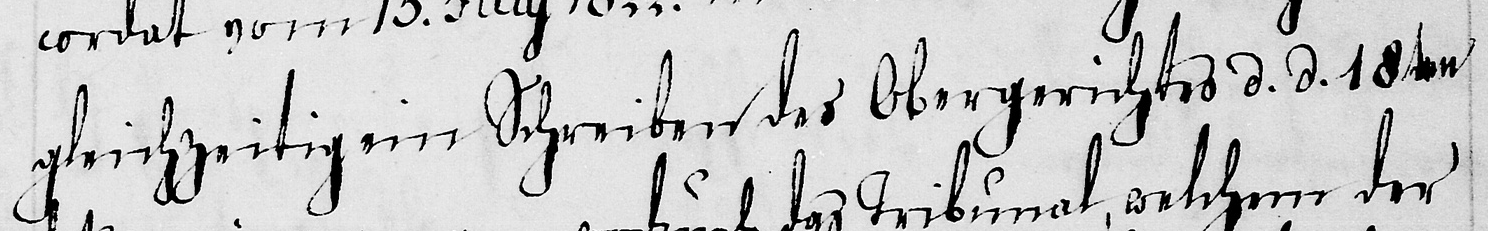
gleichzeitig ein Schreiben des Obergerichtes d.d. 18ten
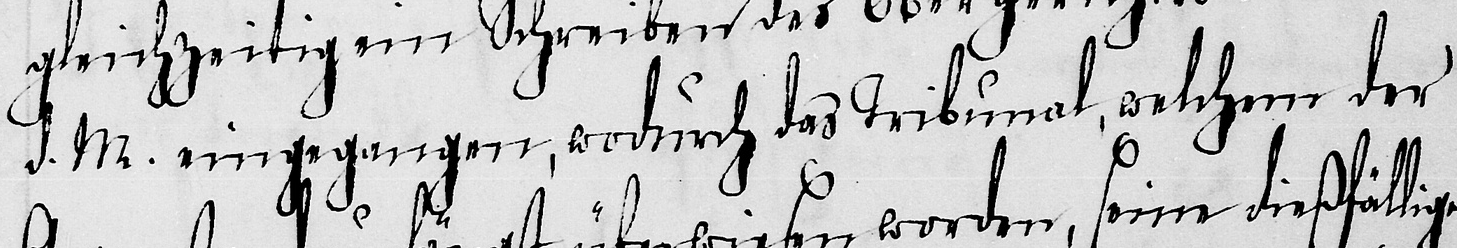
d. M. eingegangen, wodurch das Tribunal, welchem der
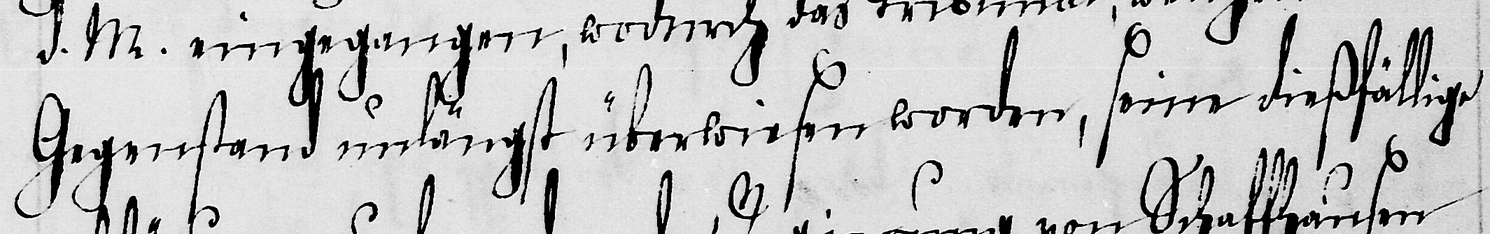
Gegenstand unlängst überwiesen worden, seine dießfällige
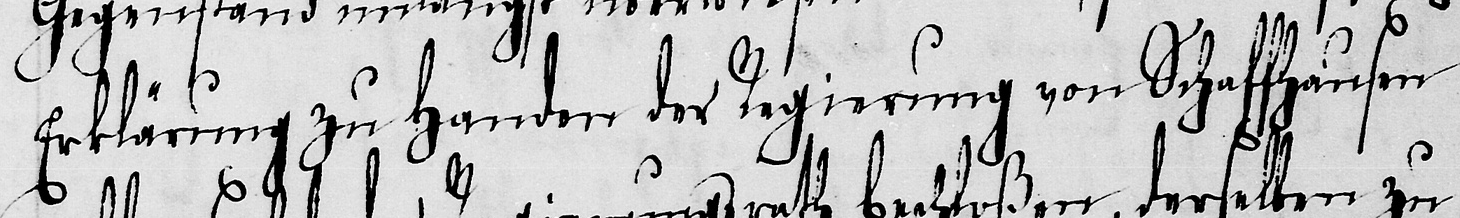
Erklärung zu Handen der Regierung von Schaffhausen
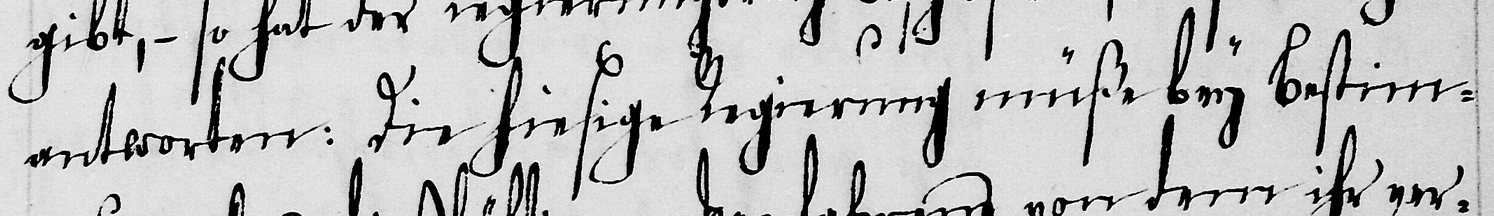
antworten: [„]Die hiesige Regierung müße bey Bestim¬
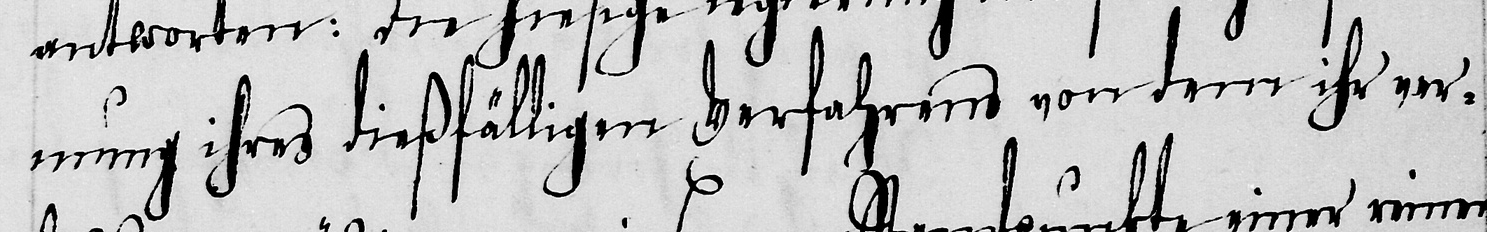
mung ihres dießfälligen Verfahrens von dem ihr ver¬
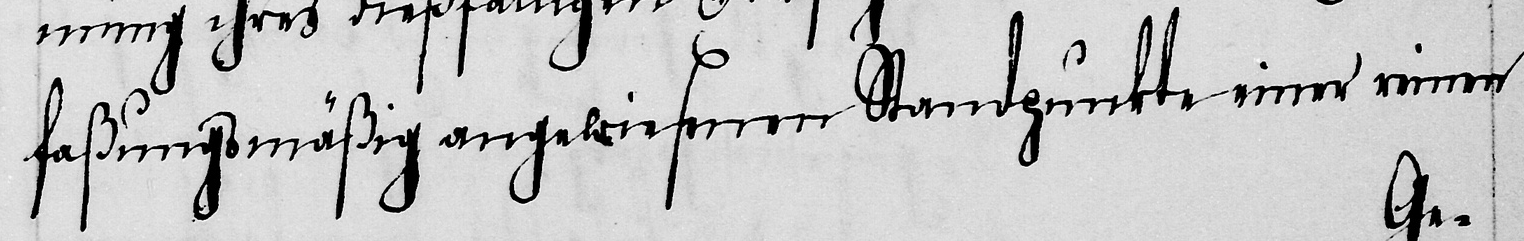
faßungsmäßig angewiesenen Standpunkte einer reinen
